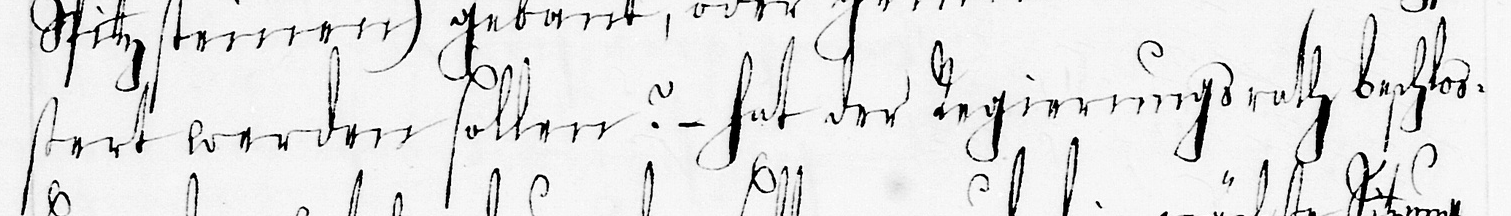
stert werden sollen? – hat der Regierungsrath beschloß¬
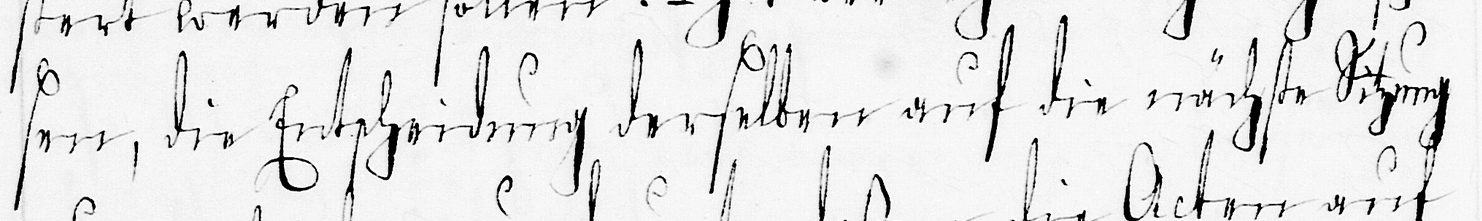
en, die Entscheidung derselben auf die nächste Sitz¬
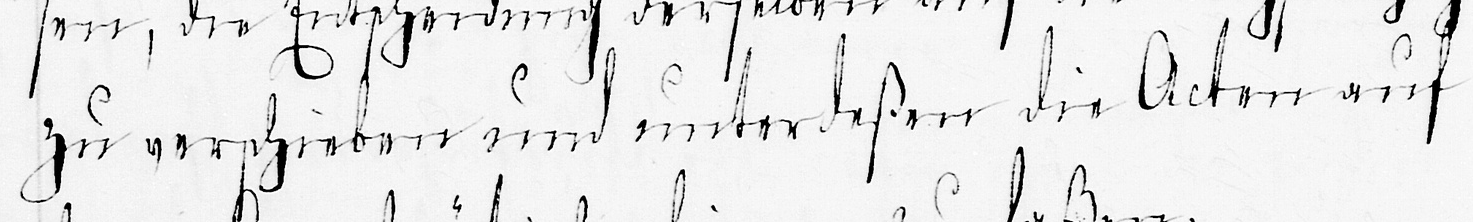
zu verschieben und unterdeßen die Acten auf
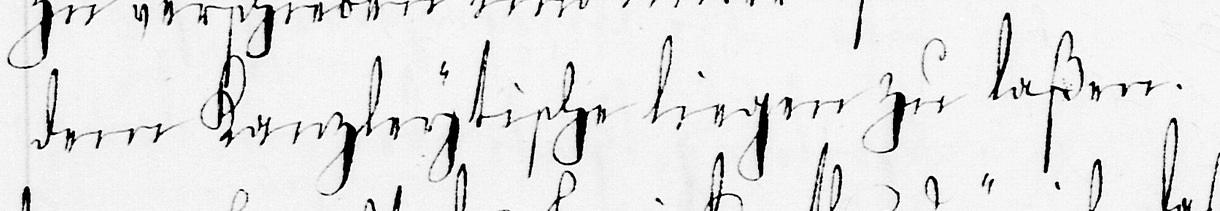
dem Kanzleytische liegen zu laßen.
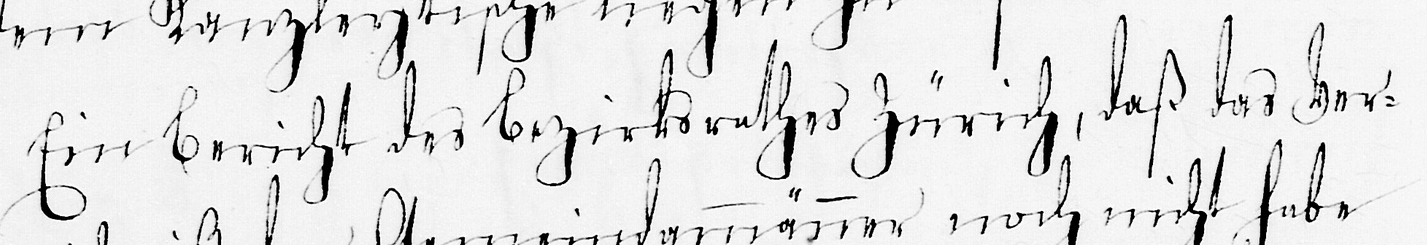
Ein Bericht des Bezirksrathes Zürich, daß das Ver¬
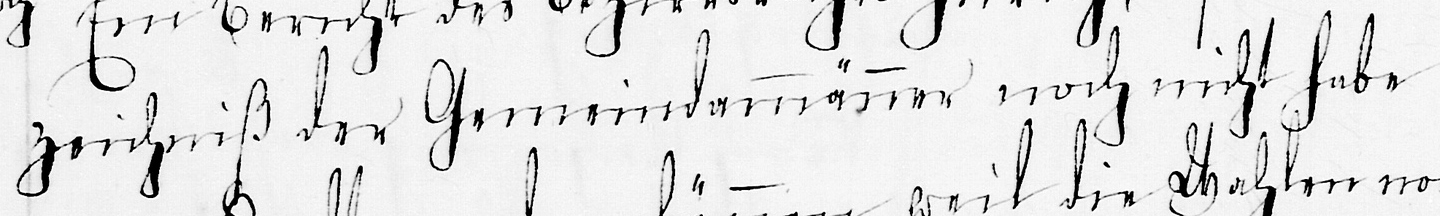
zeichniß der Gemeindammänner noch nicht habe
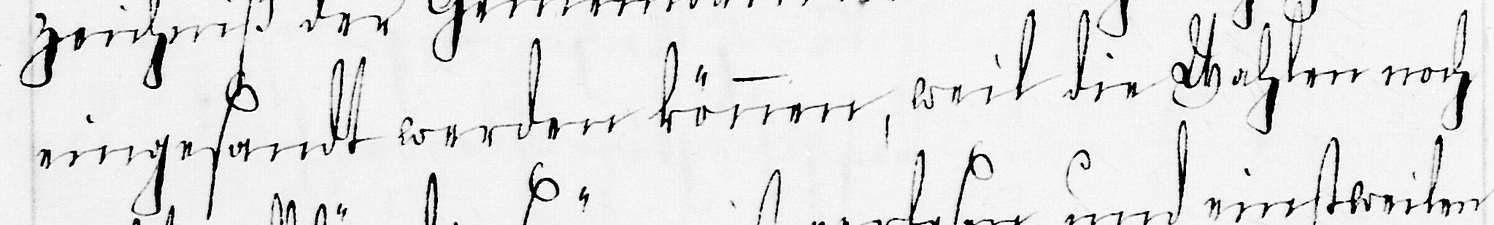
eingesandt werden können, weil die Wahlen noch
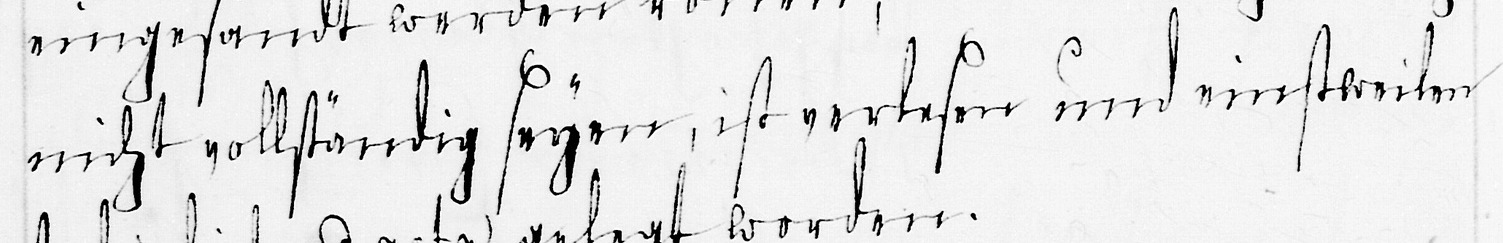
nicht vollständig seyen, ist verlesen und einstweilen
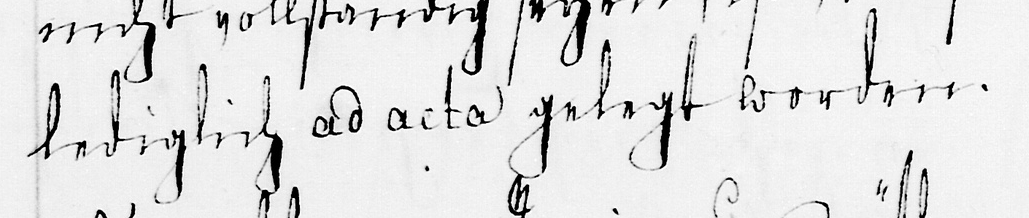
lediglich ad acta gelegt worden.
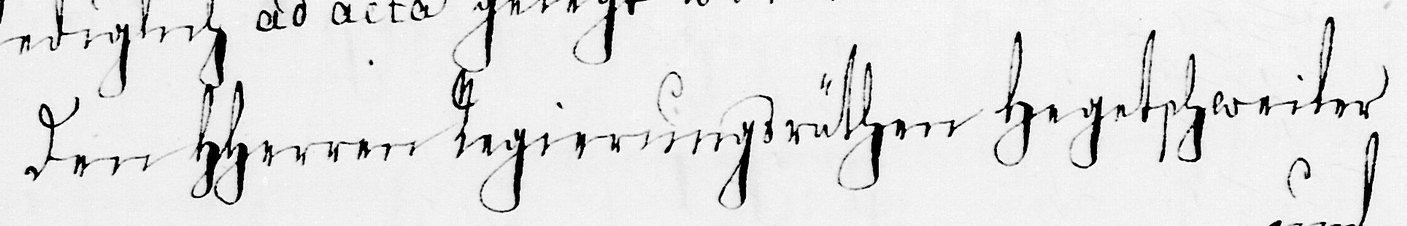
Den HHerren Regierungsräthen Hegetschweiler
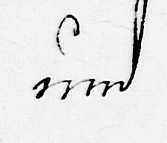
ung
